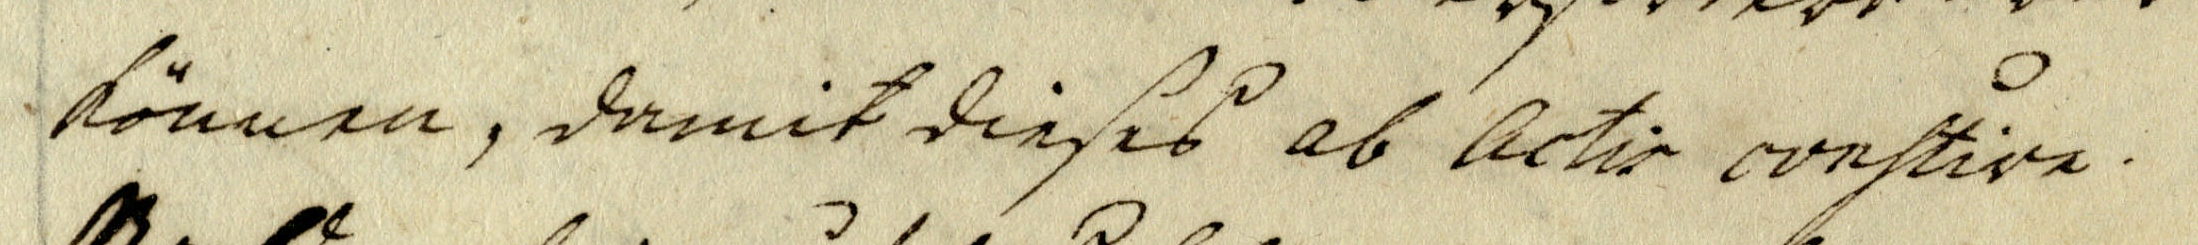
können, damit dieses ab Actis constire.
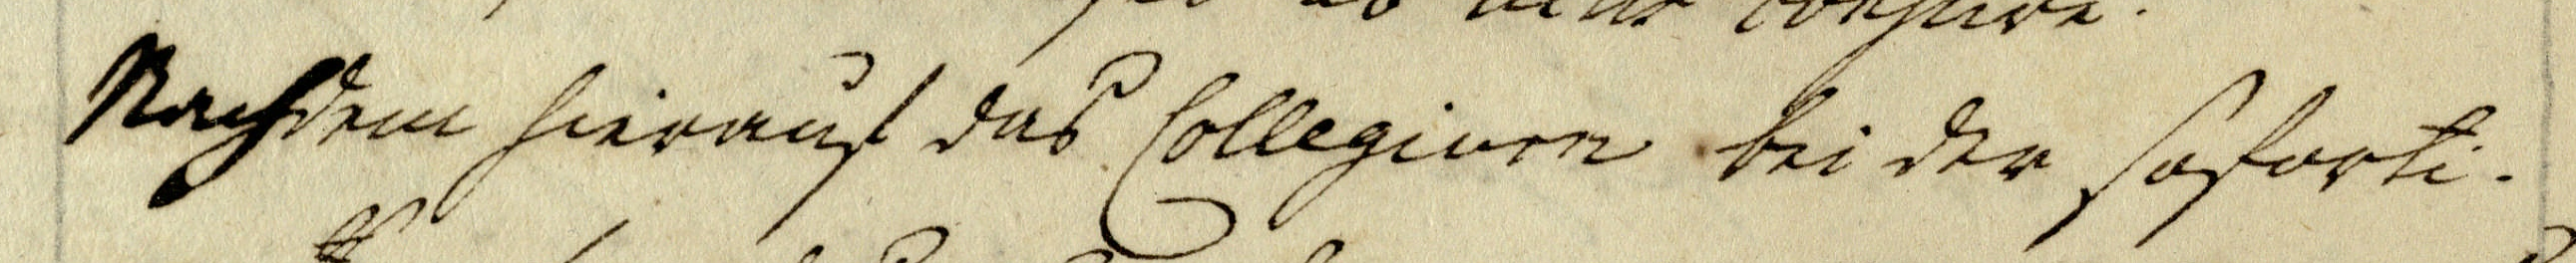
Nachdem hierauf das Collegium bei der soforti¬
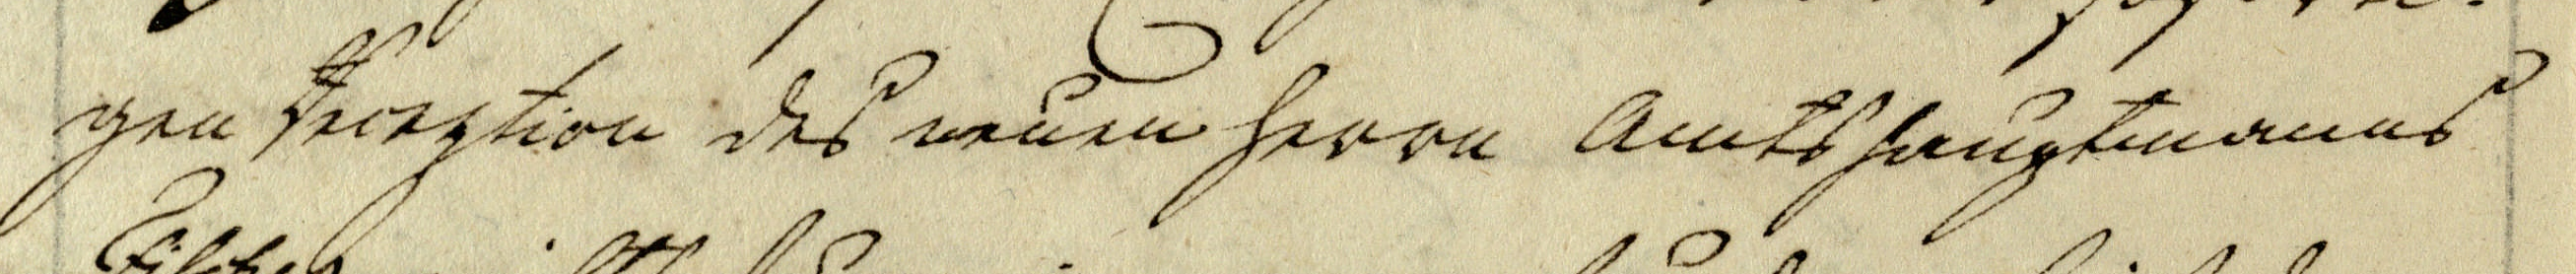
gen Reception des neuen Herrn Amtshauptmanns
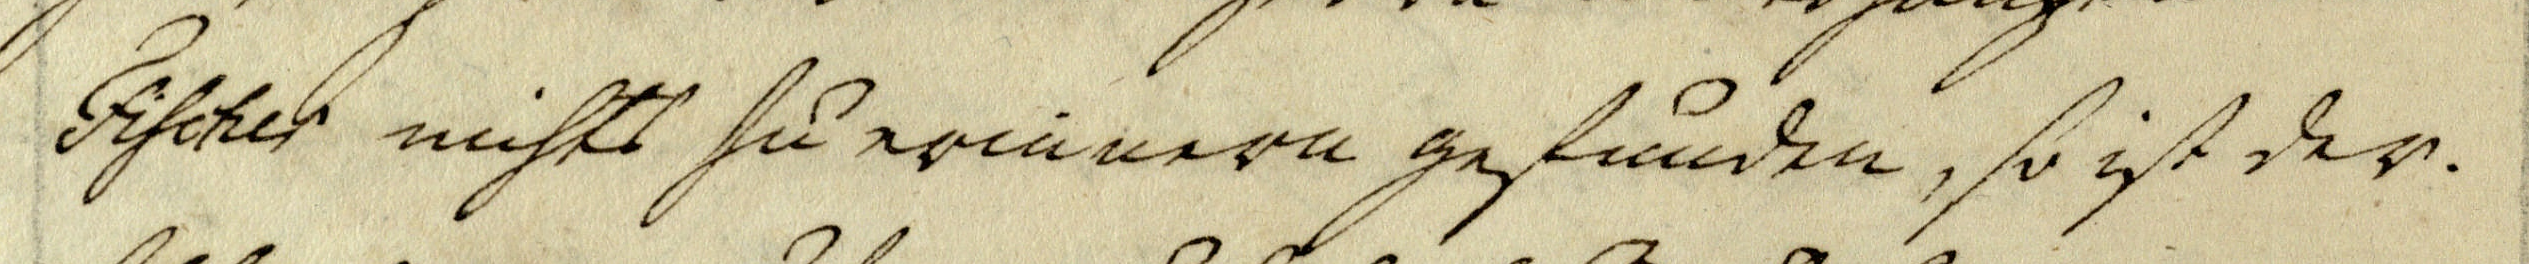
Fischer nichts zu erinnern gefunden, so ist der¬
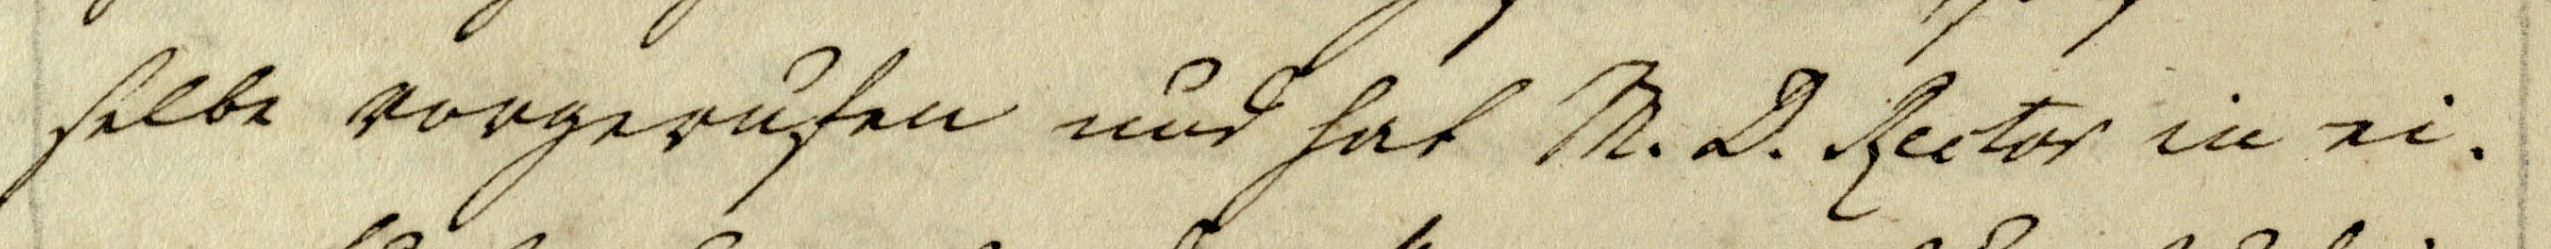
selbe vorgerufen und hat M. D. Rector in ei¬
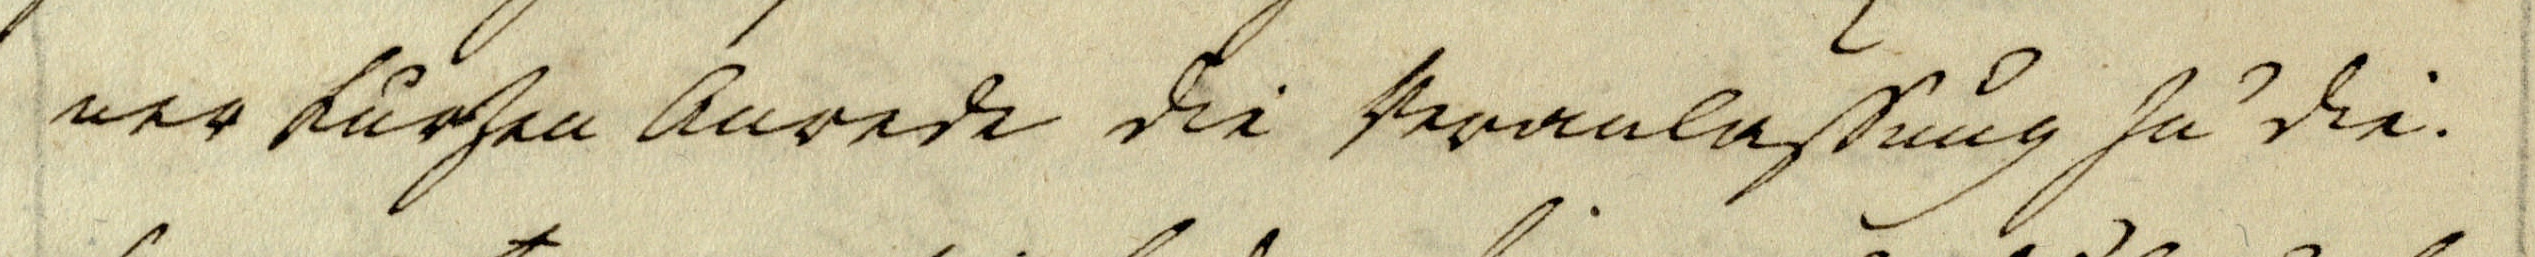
ner kurzen Anrede die Veranlassung zu die¬
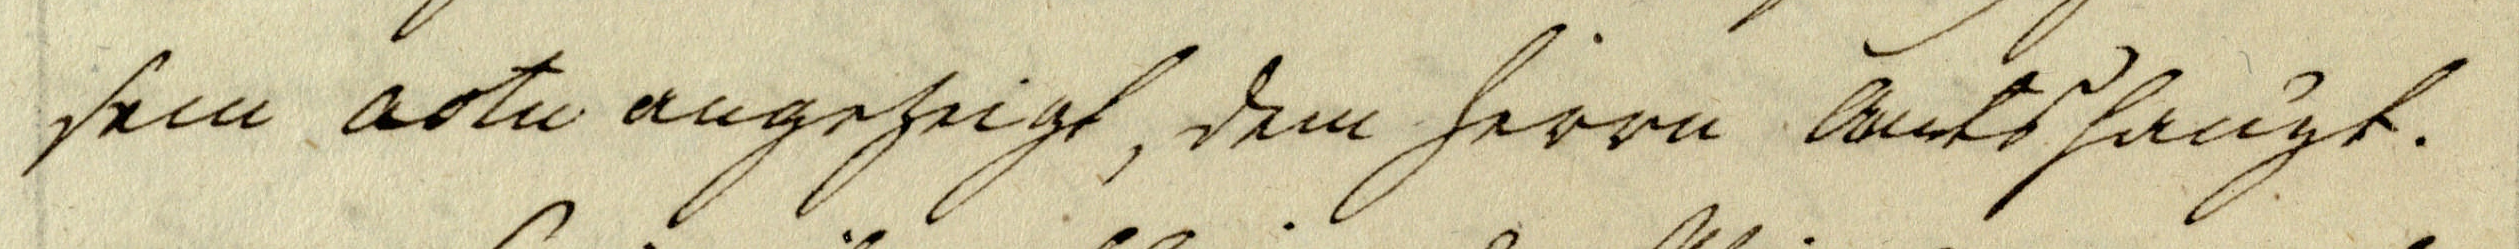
sem actu angezeigt, dem Herrn Amtshaupt¬
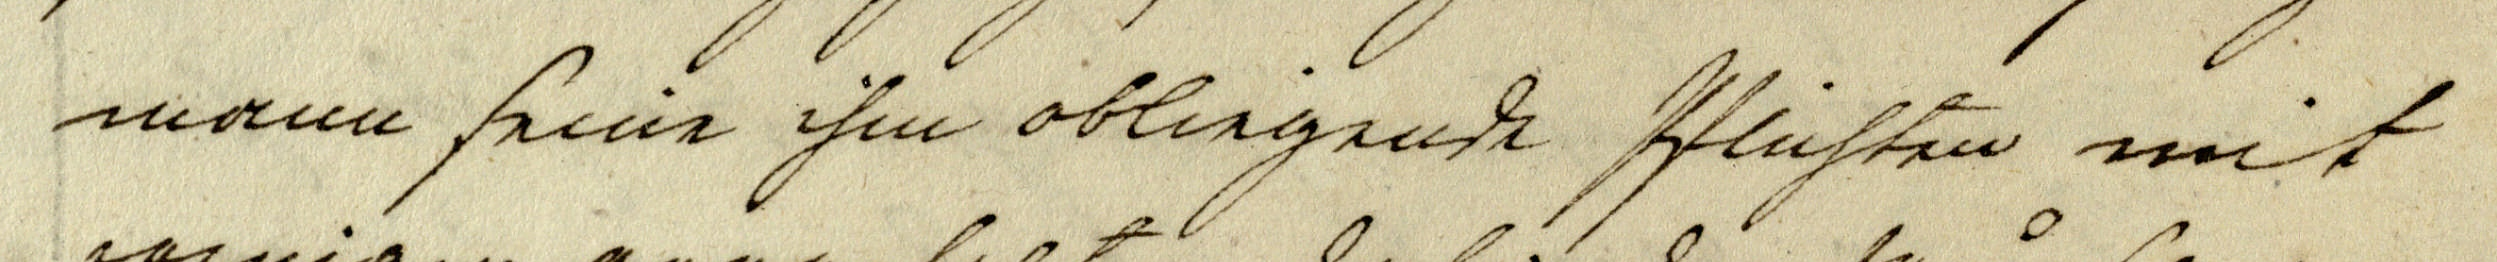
mann seine ihm obliegende Pflichten mit
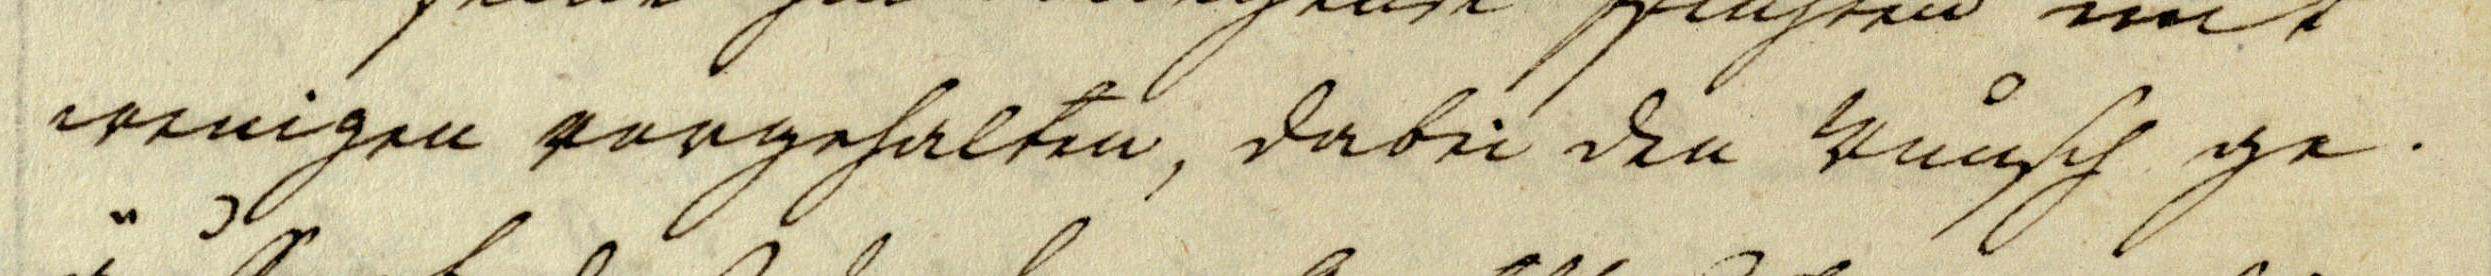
wenigen vorgehalten, dabei den Wunsch ge¬
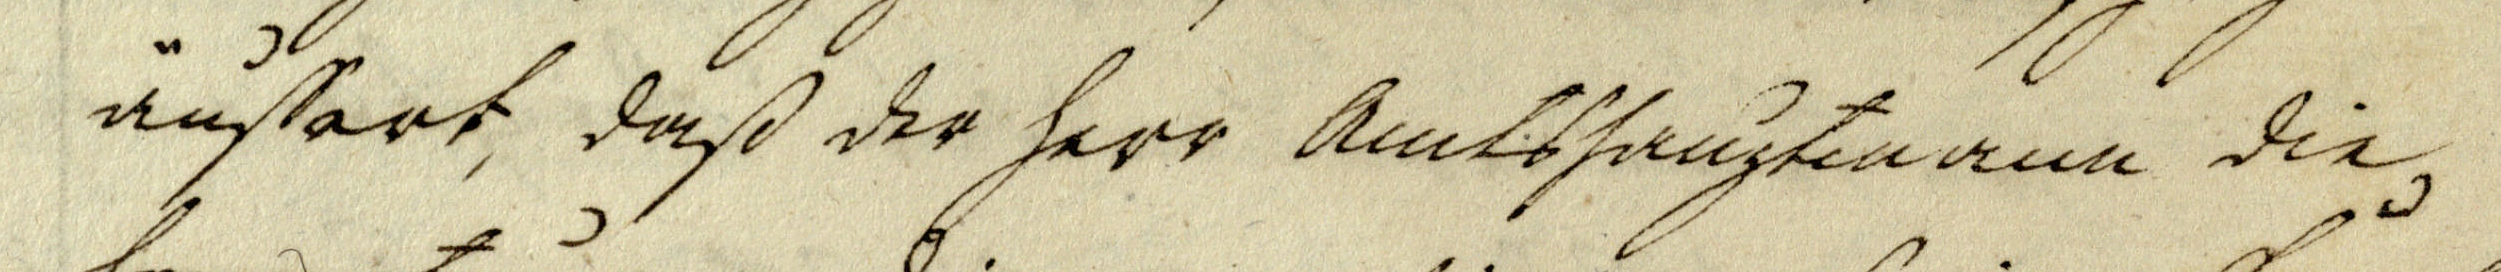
äussert, daß der Herr Amtshauptmann die
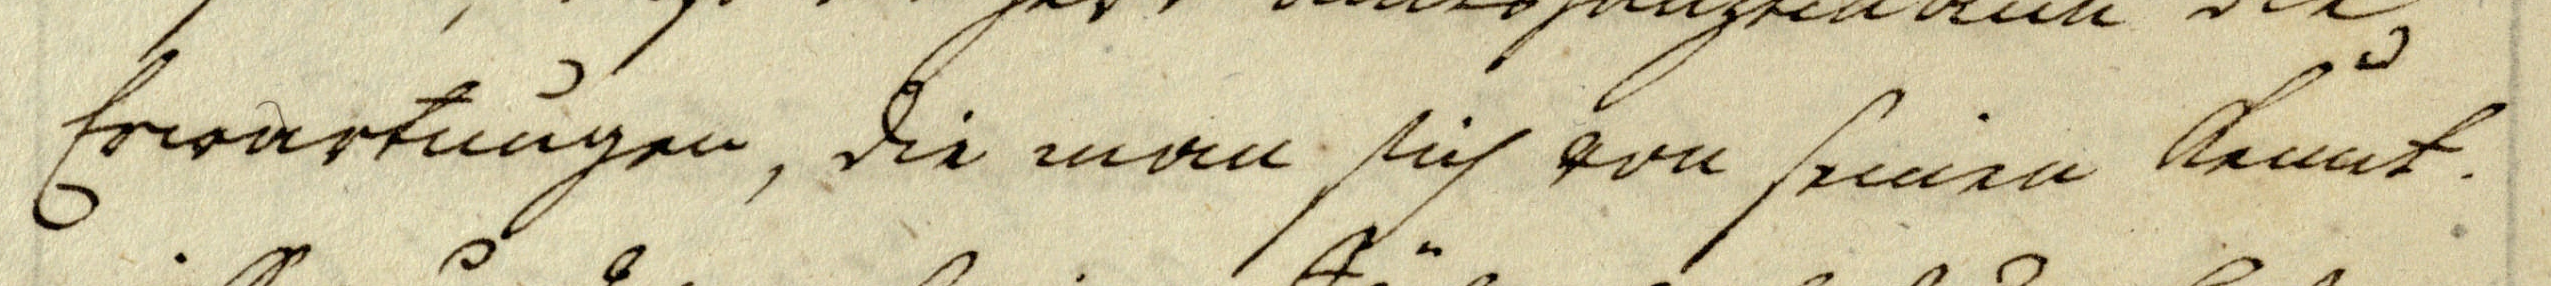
Erwartungen, die man sich von seinen Kennt¬
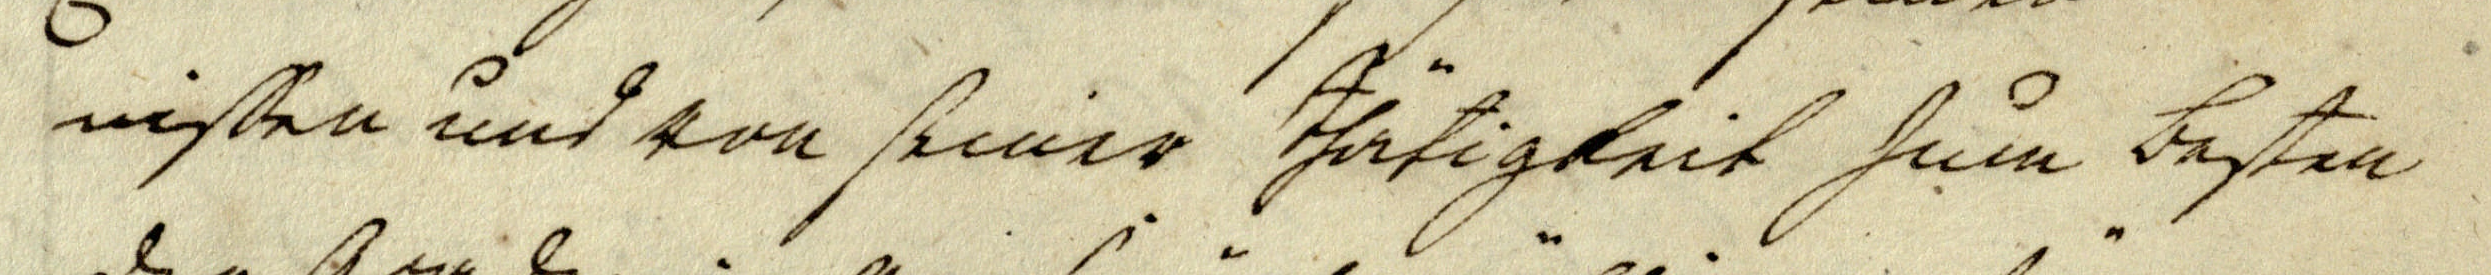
nissen und von seiner Thätigkeit zum Besten
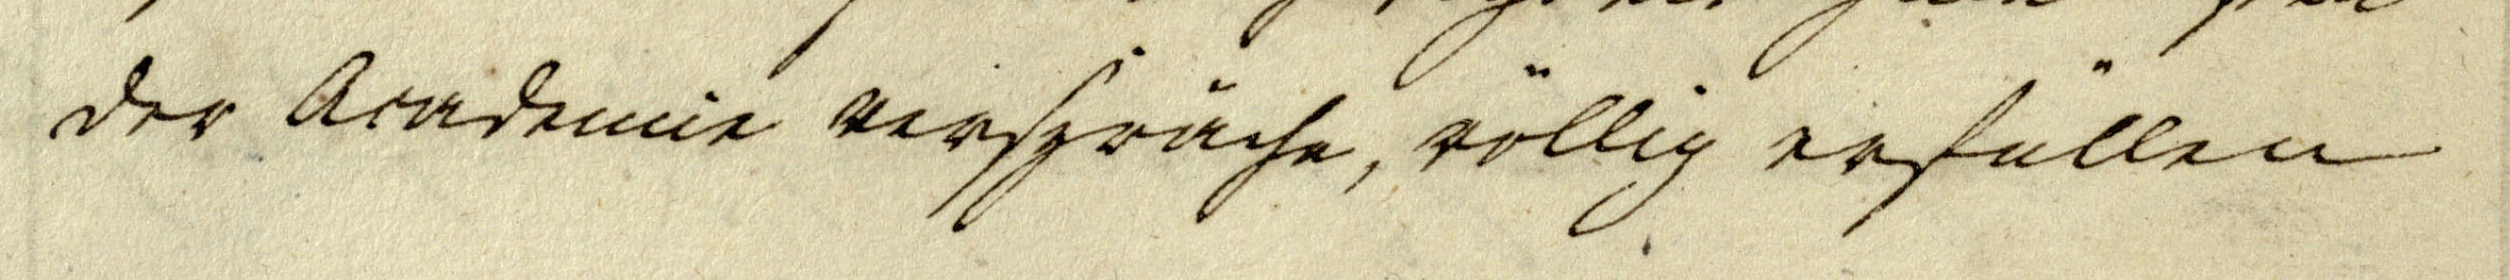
der Academie verspräche, völlig erfüllen
